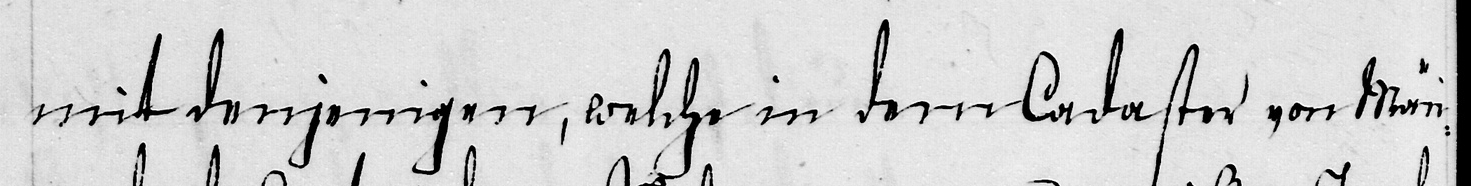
mit denjenigen , welche dem Cadaster von Män¬
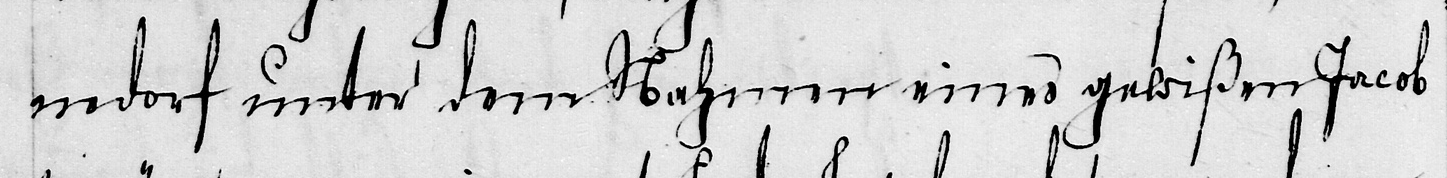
nedorf unter dem Nahmen eines gewißen Jacob
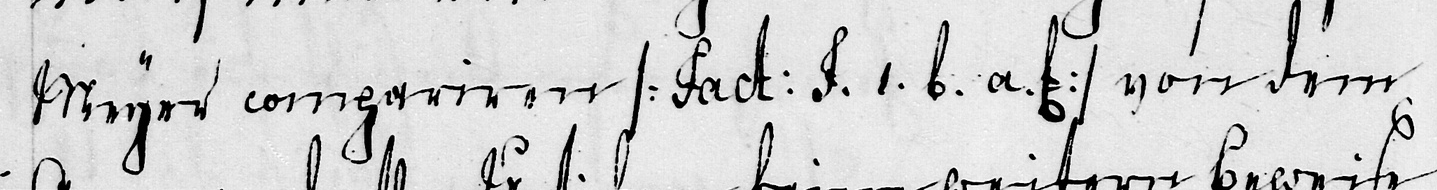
Meyer compariren [Fact: f. 1. b. a. f[olgende]] von dem
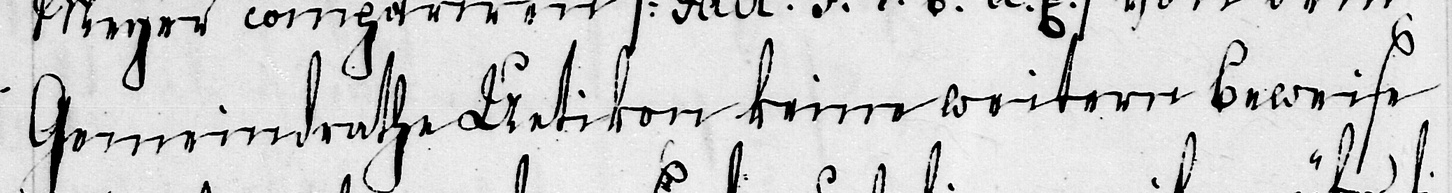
Gemeindrathe Uetikon keine weitern Beweise
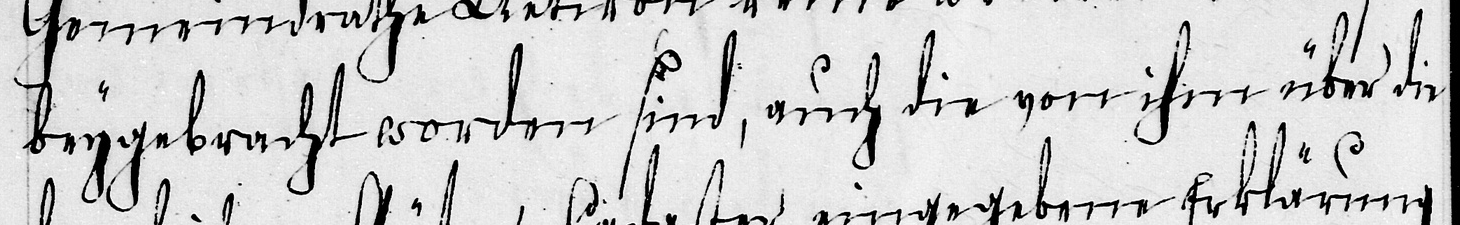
beygebracht worden sind, auch die von ihm über die
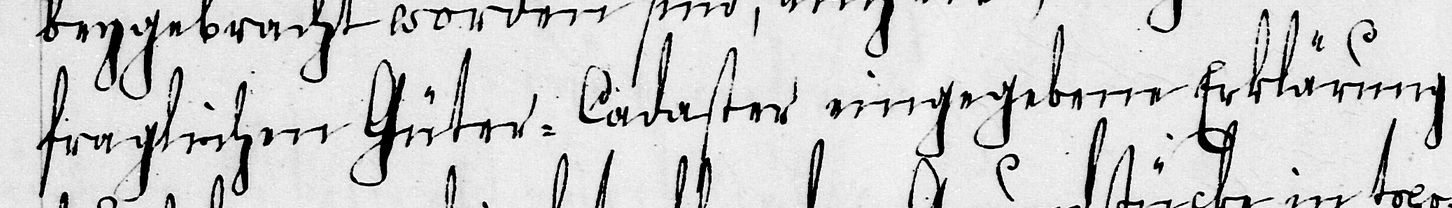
fraglichen Güter-Cadaster eingegebene Erklärung
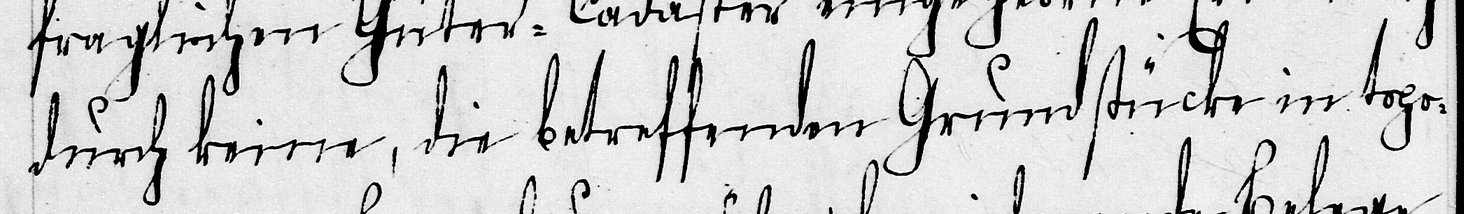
durch keine, die betreffenden Grundstücke in topo¬
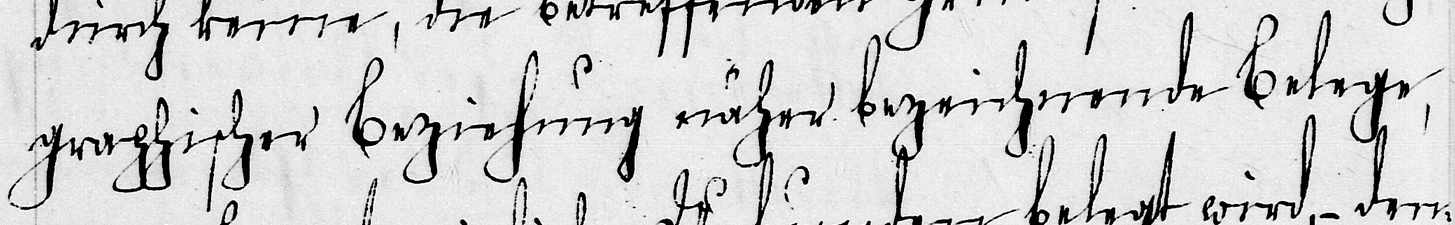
graphischer Beziehung näher bezeichnende Belege,
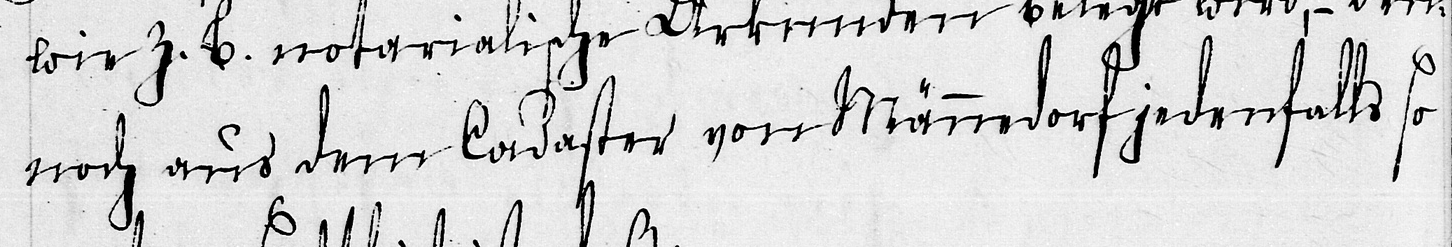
noch aus dem Cadaster von Männedorf jedenfalls so
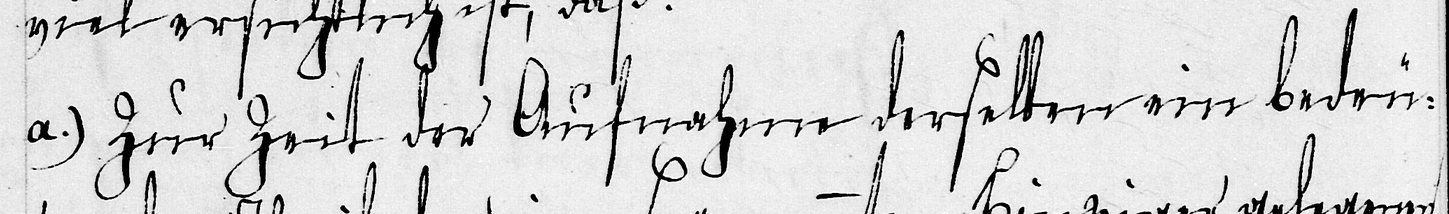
a.) Zur Zeit der Aufnahme derselben ein bedeu¬
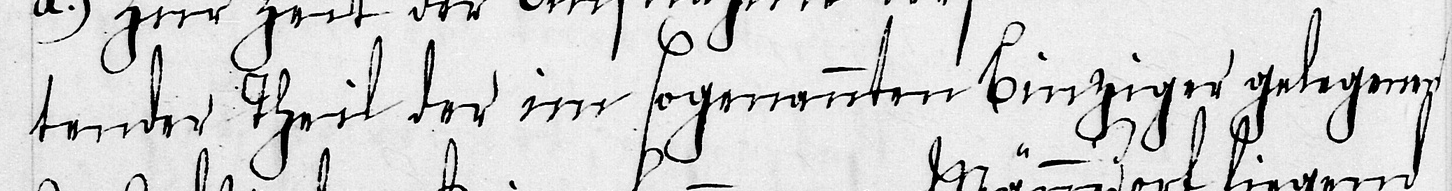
tender Theil der im sogenannten Binziger gelegenen
